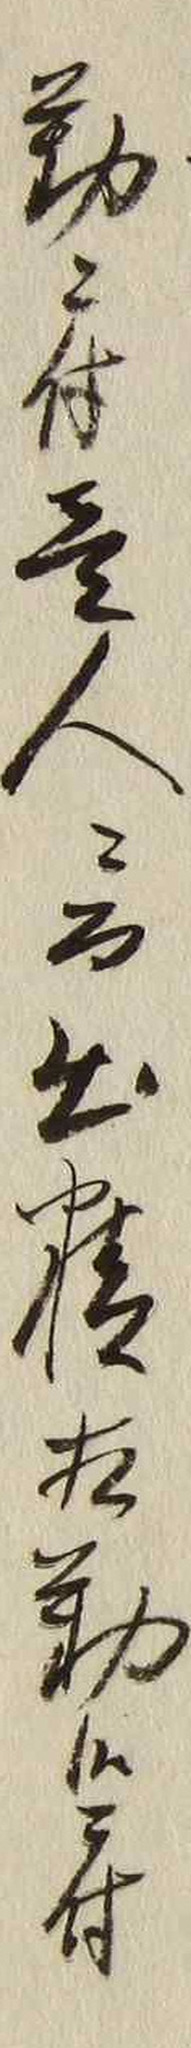勤ニ付壱人ニ而出精相勤候ニ付
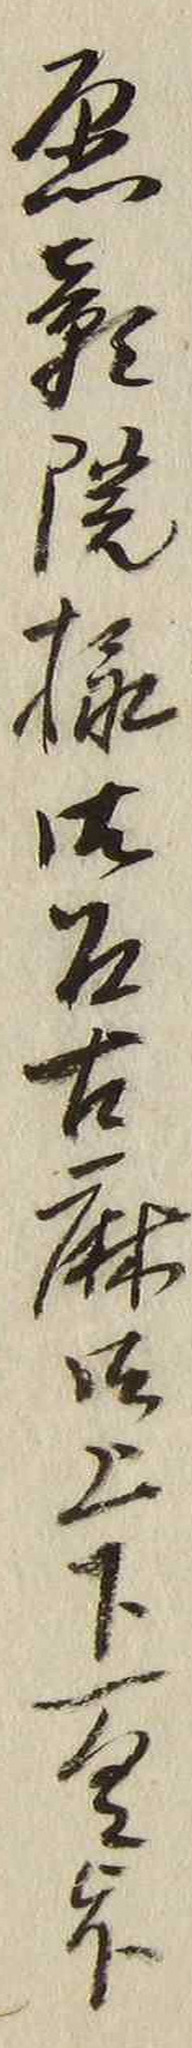愿彰院様御召古麻御上下一具被下

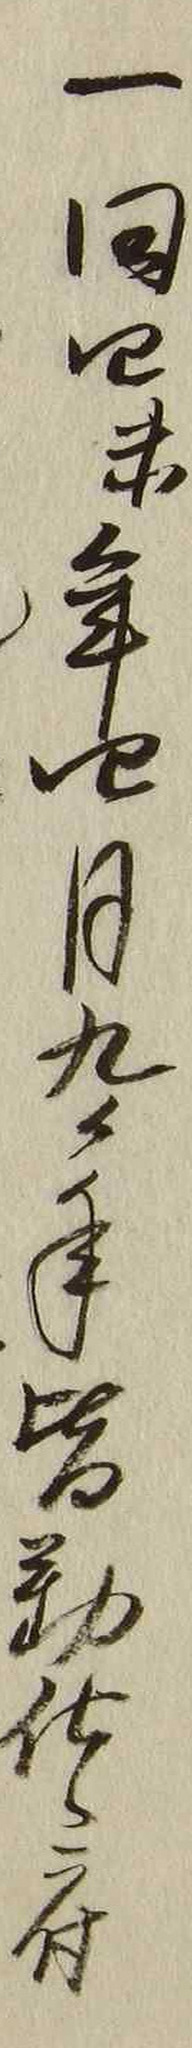一同四未年四月九ケ年皆勤仕候ニ付
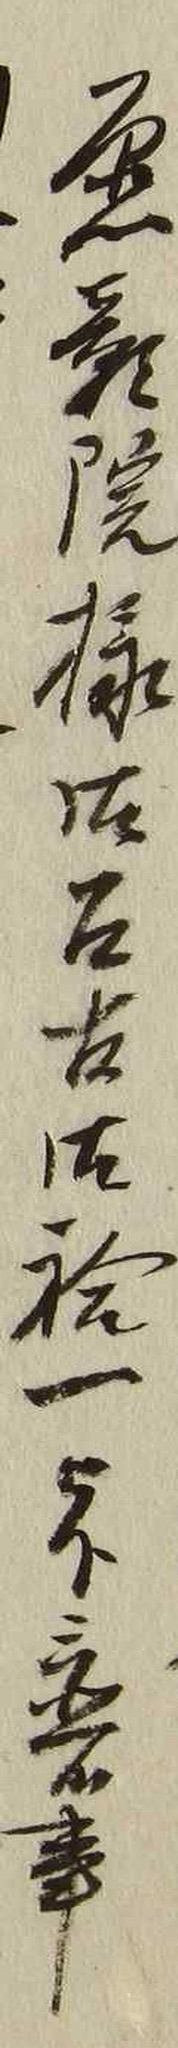愿彰院様御召古御袷一被下置候事
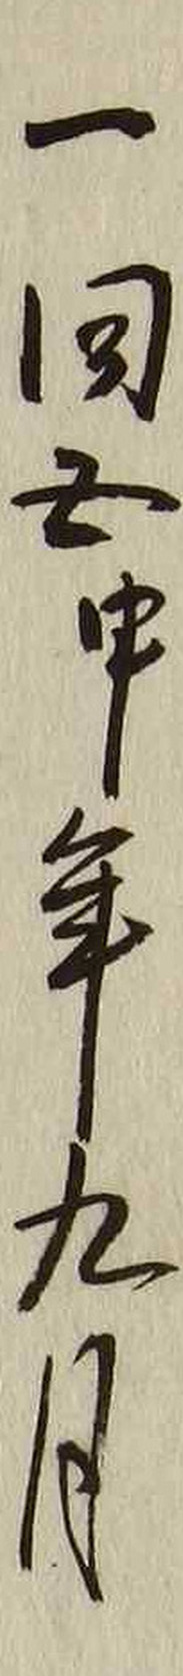一同五申年九月
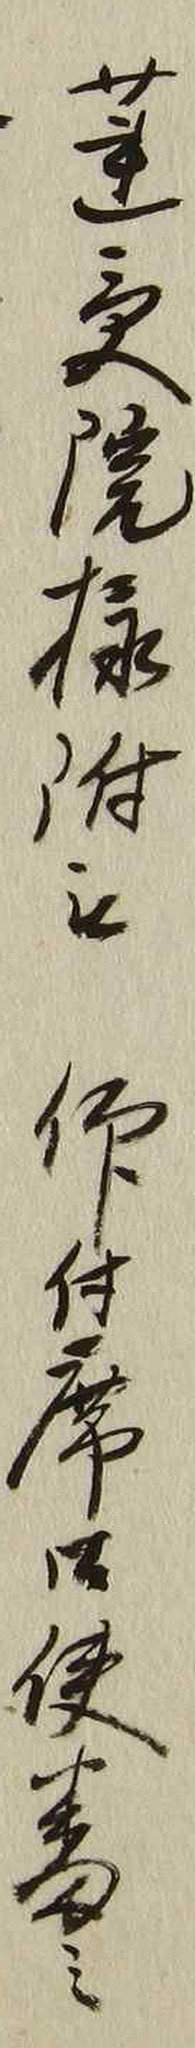蓮受院様附被仰付席御使番之
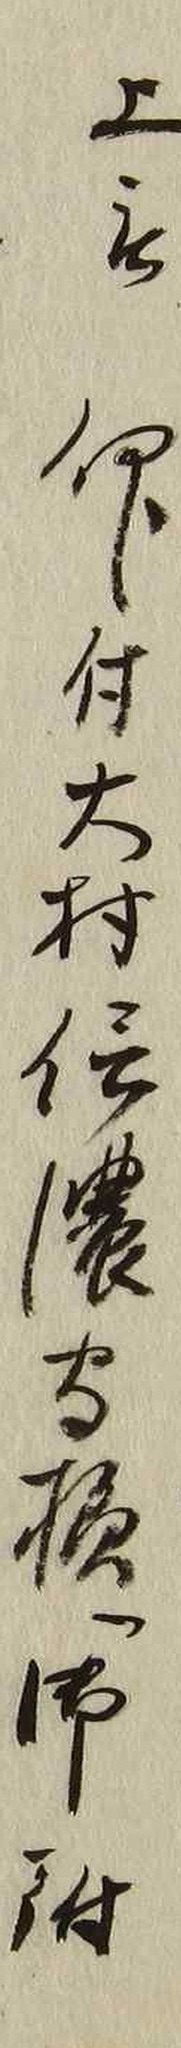上被仰付大村信濃守様へ御附
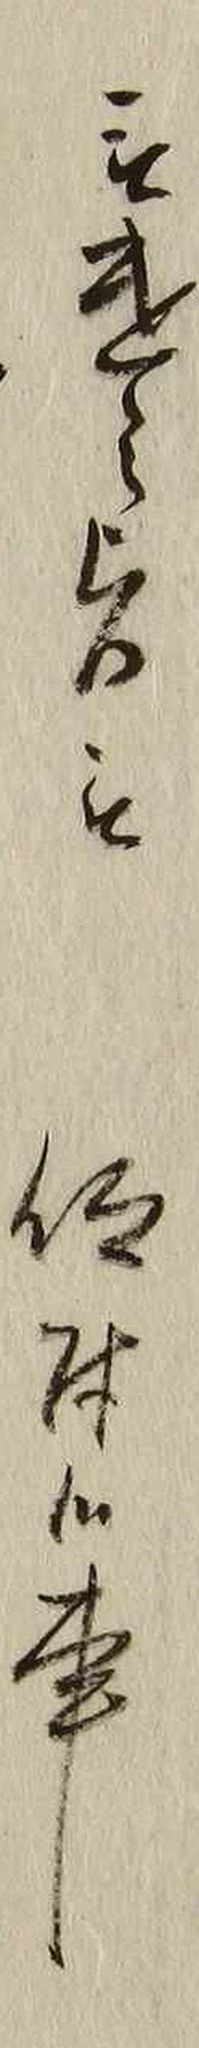被遣之旨被仰付候事
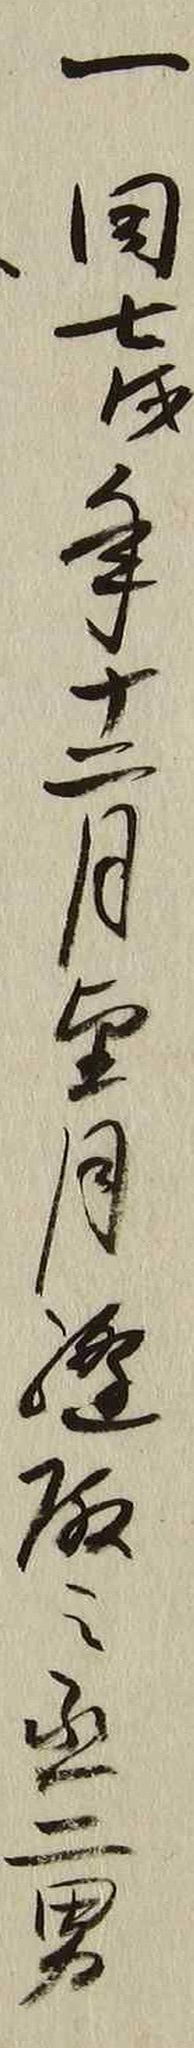一同七戌年十二月望月縫殿之丞二男
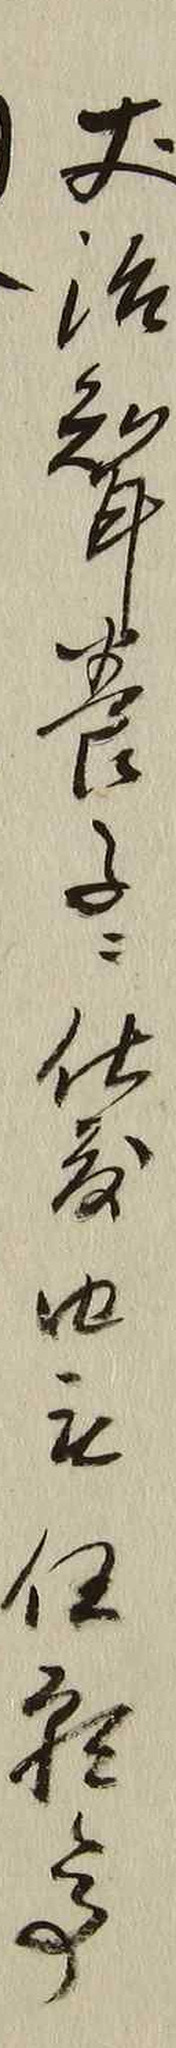丈治婿養子ニ仕度由被任願候事
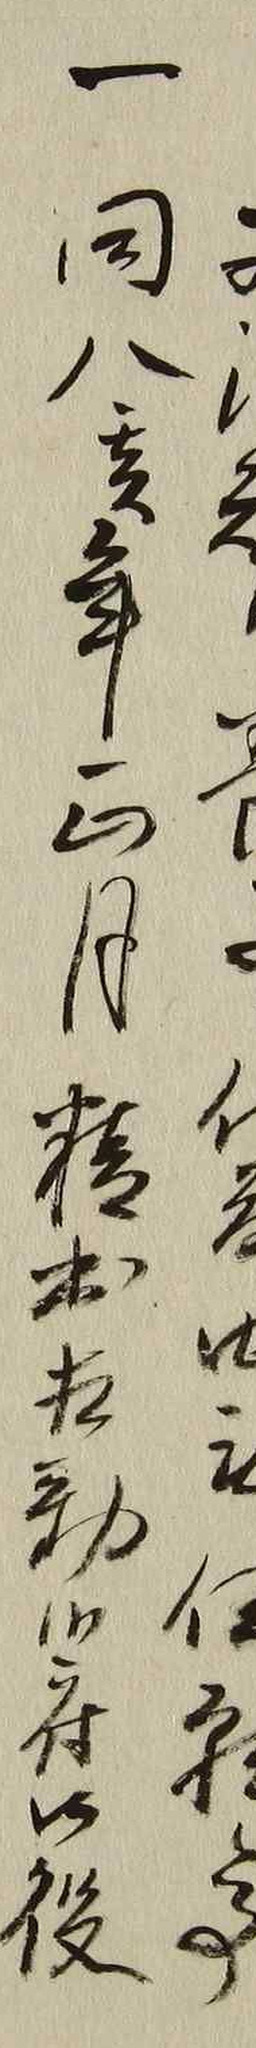一同八亥年正月精出相勤候ニ付御役
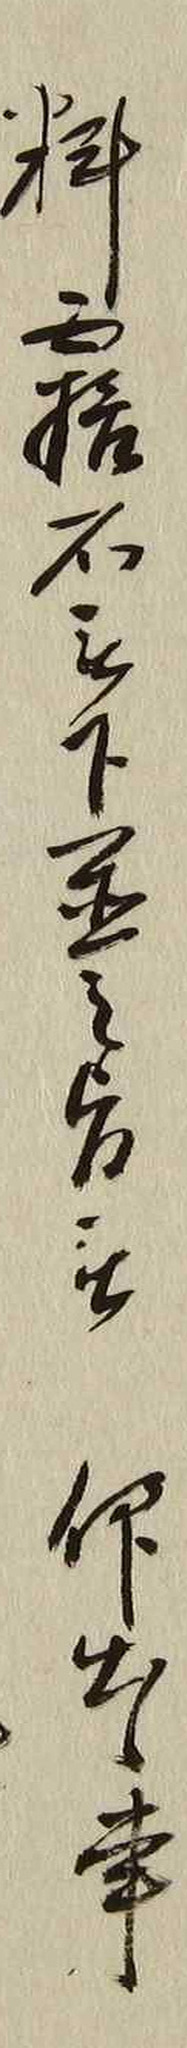料五拾石被下置之旨被仰出候事
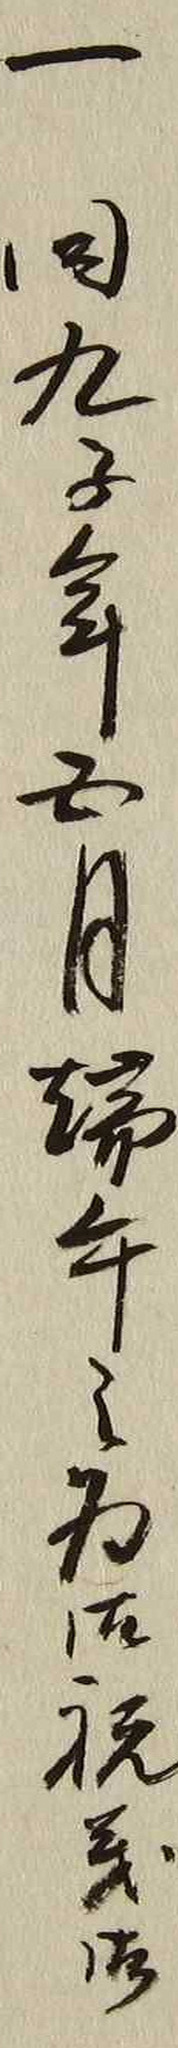一同九子年五月端午之為御祝義御
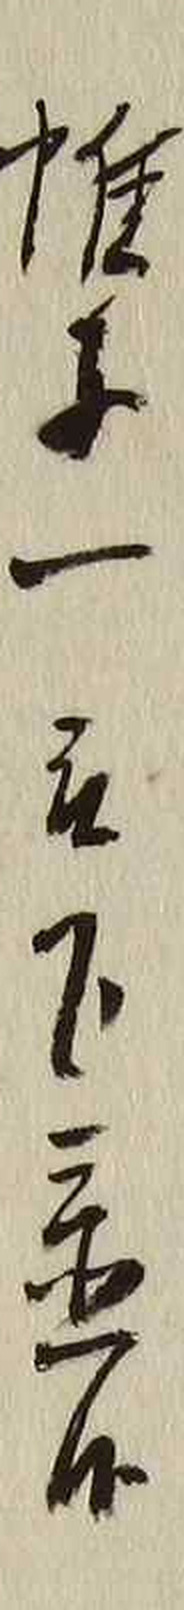帷子一被下置候
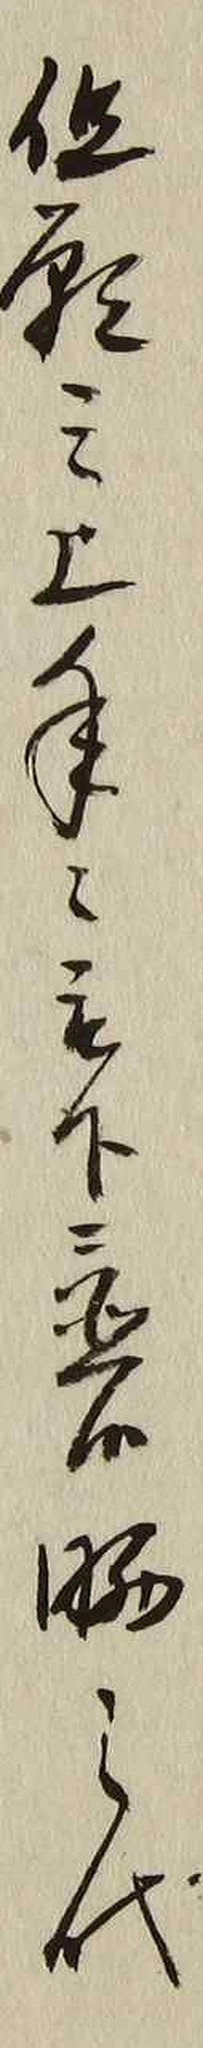但願之上年々被下置候晒之代
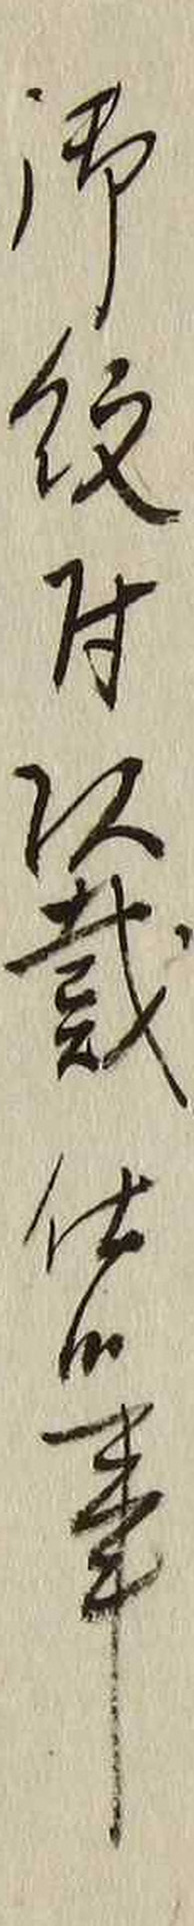御紋付頂戴仕候事
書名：諸士系譜　巻之349　も之部5
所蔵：会津若松市立会津図書館
